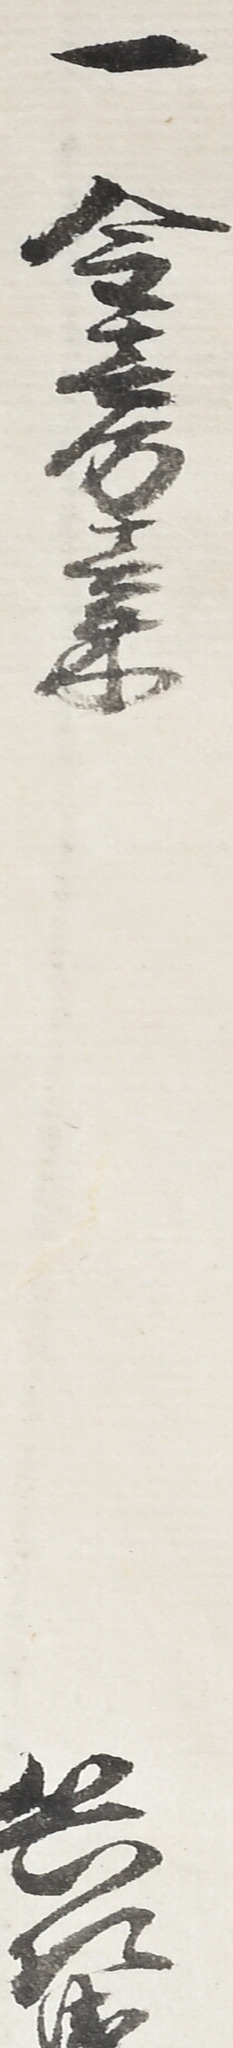一金壱分壱朱兵左衛門
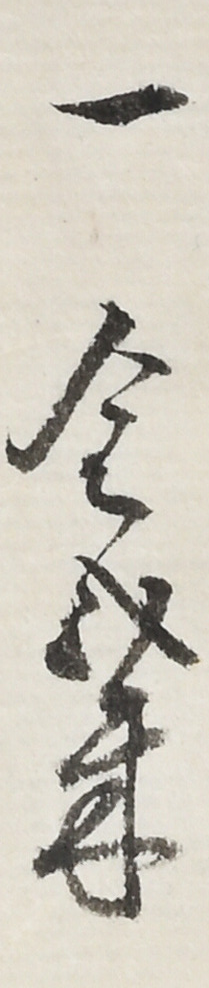一金弐朱十蔵
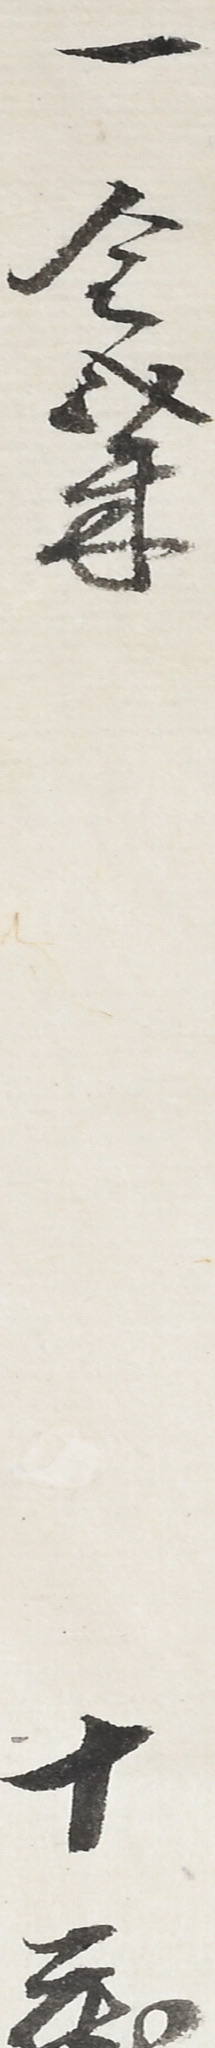一金弐朱十蔵

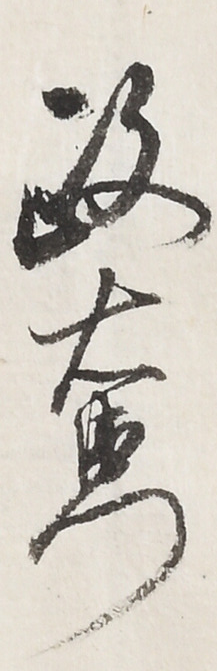仁右衛門
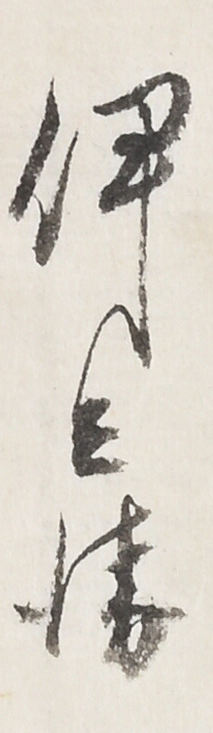小兵衛
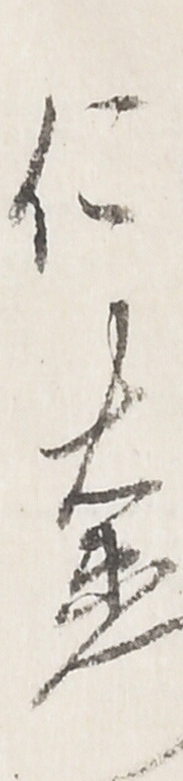仁右衛門
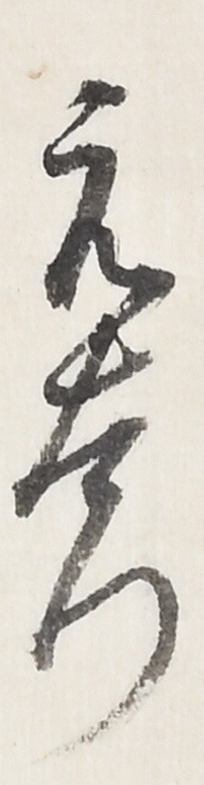仁右衛門
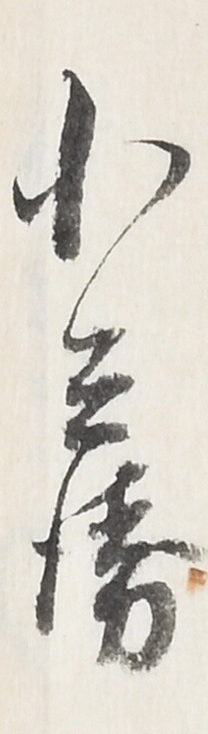小兵衛
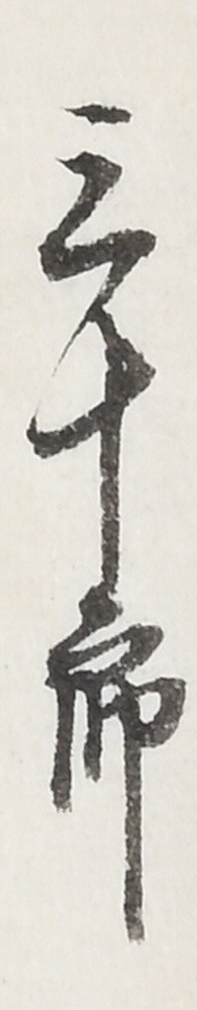三十郎
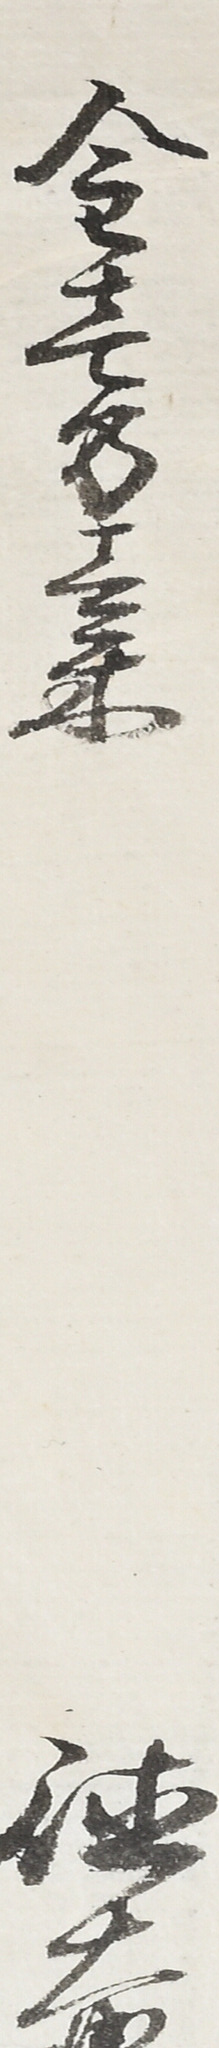一金壱分壱朱徳右衛門
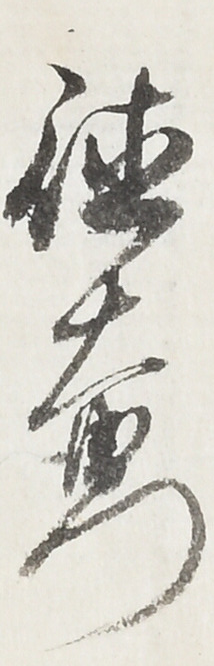仁右衛門
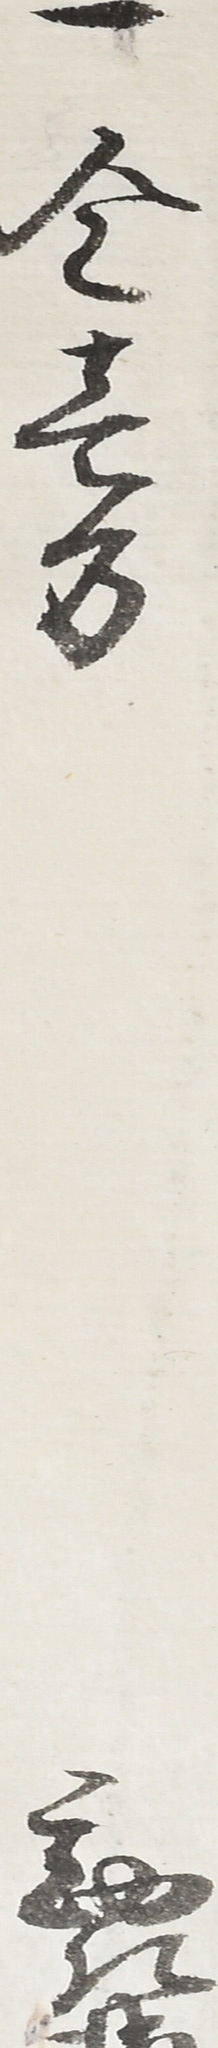一金壱分勘左衛門
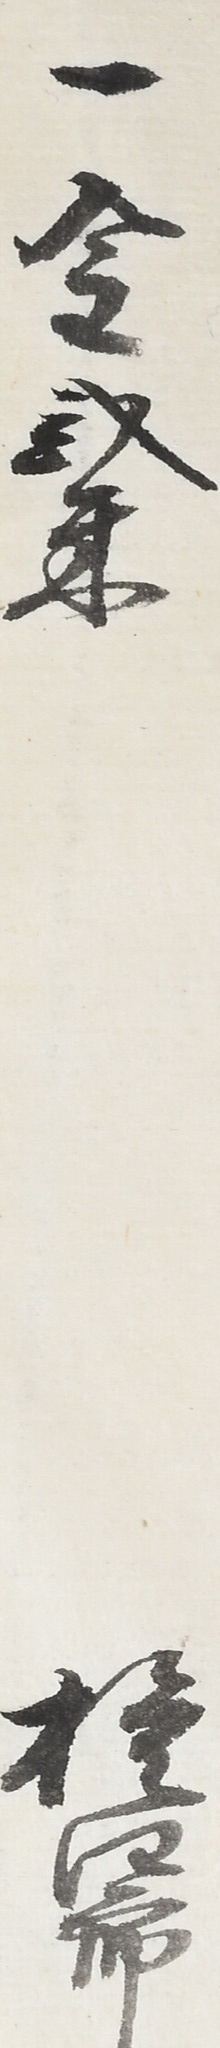一金弐朱権四郎

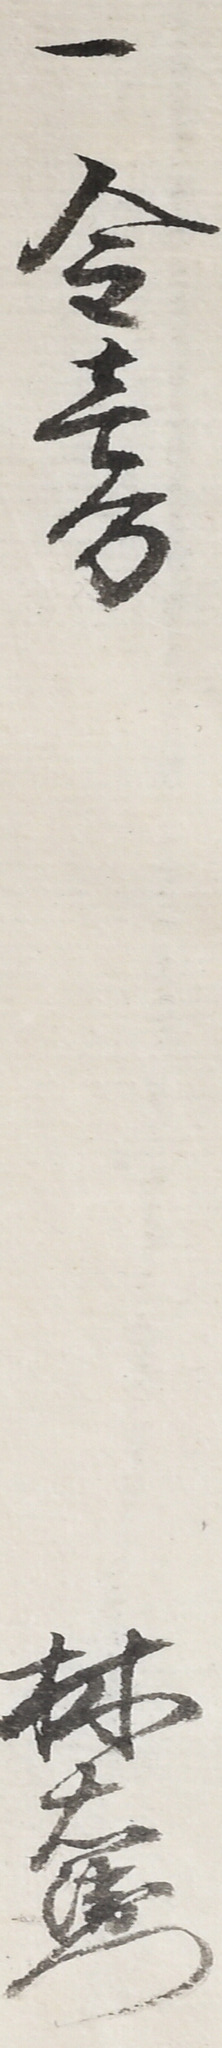一金壱分林右衛門
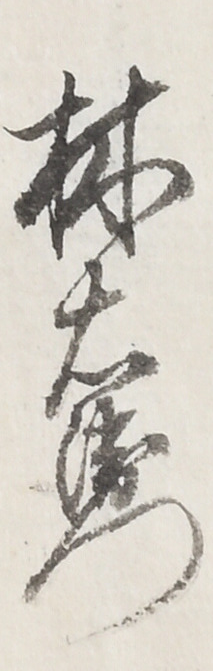喜右衛門
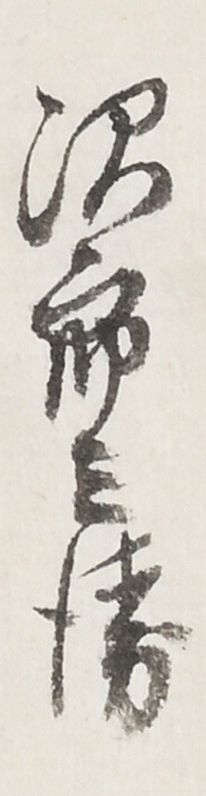五郎兵衛
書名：御拝地百五拾年御祝儀献上御目録名前
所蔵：伊那市立高遠町図書館・合同会社AMANE
